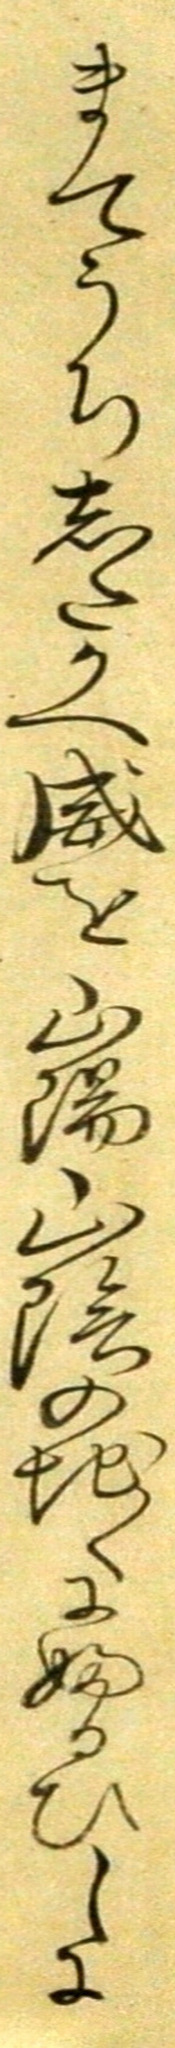まてうちしたかへ威を山陽山陰の地ゝにふるひしに
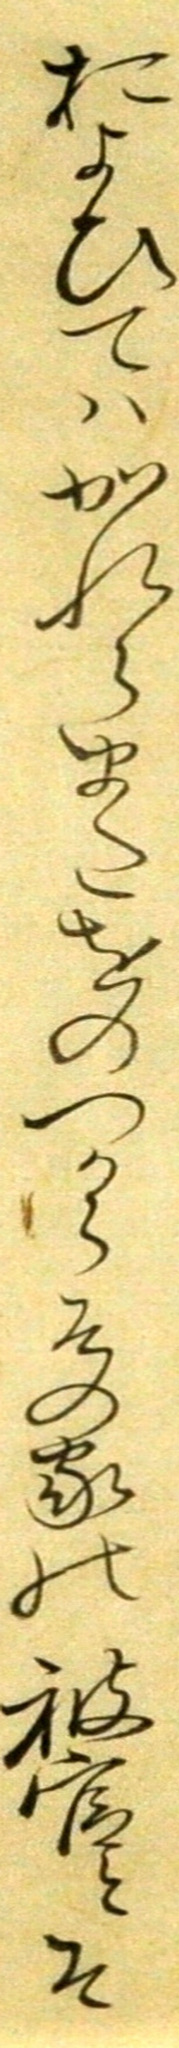およひてはかれらまたをのつからその家の被官とそ
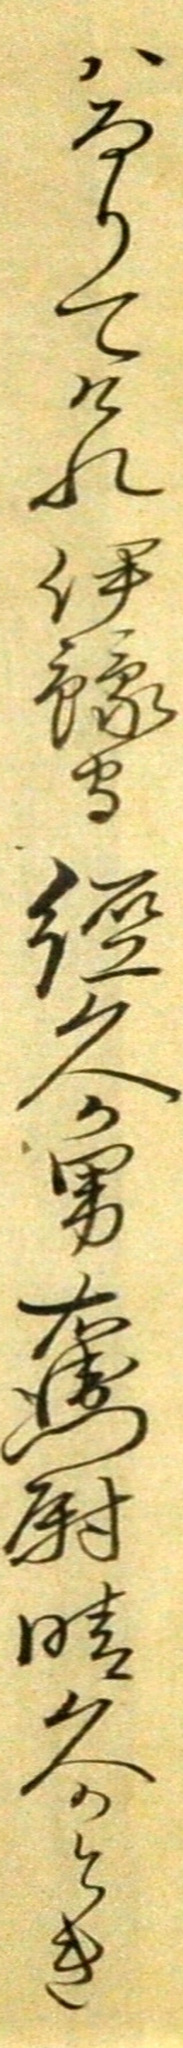はなりてけれ伊予守経久か男左衛門尉晴久かとき
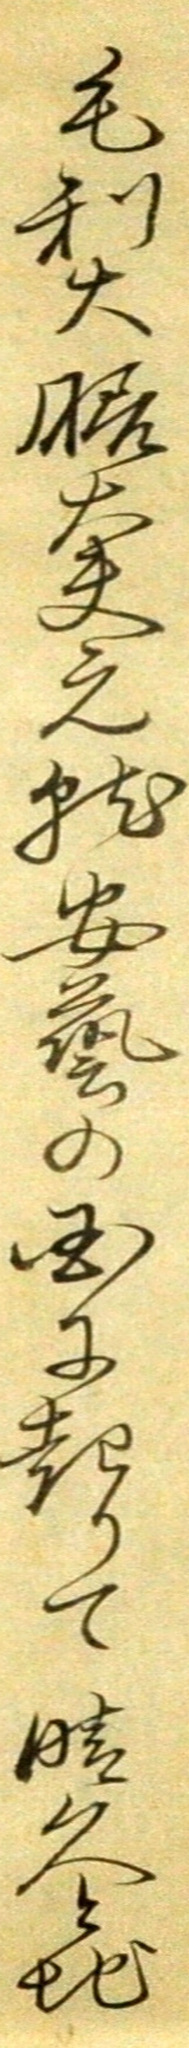毛利大膳大夫元就安芸の国に起りて晴久と地
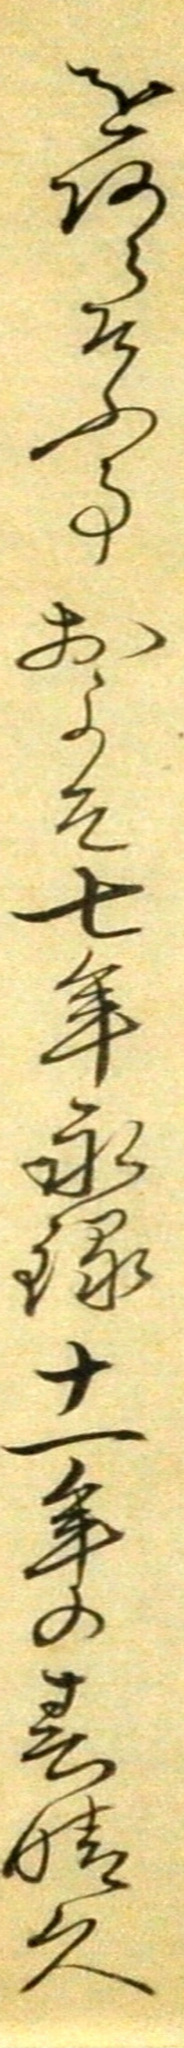をあらそふ事およそ七年永禄十一年の春晴久
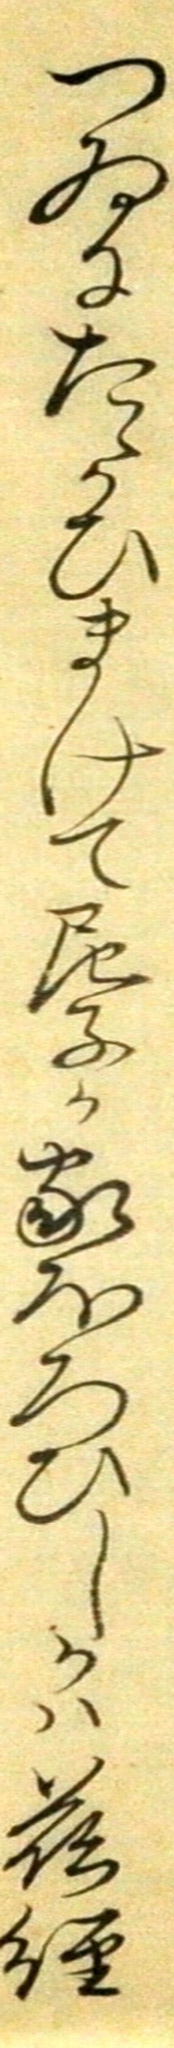つゐにたゝかひまけて尼子か家ほろひしかは茲経
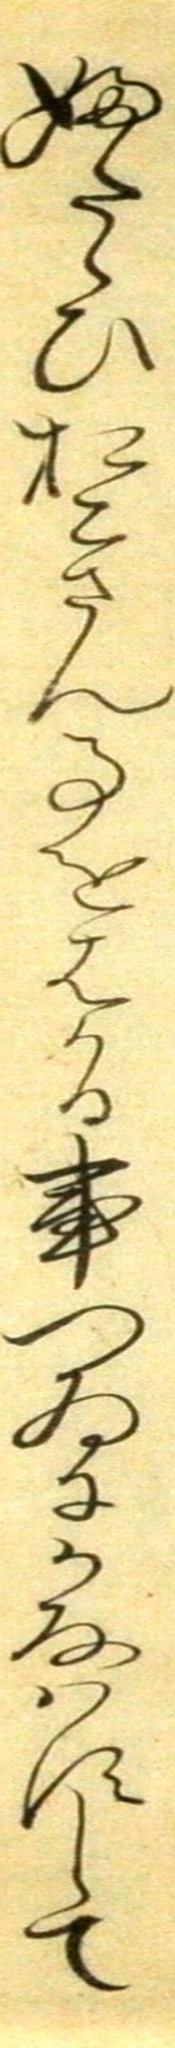ふたゝひおこさん事をはかる事つゐにかなはすして
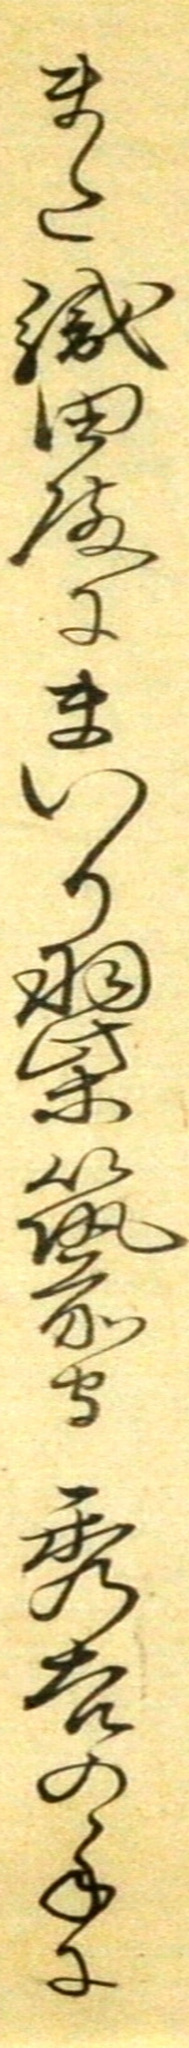また織田殿にまいり羽柴筑前守秀吉の手に
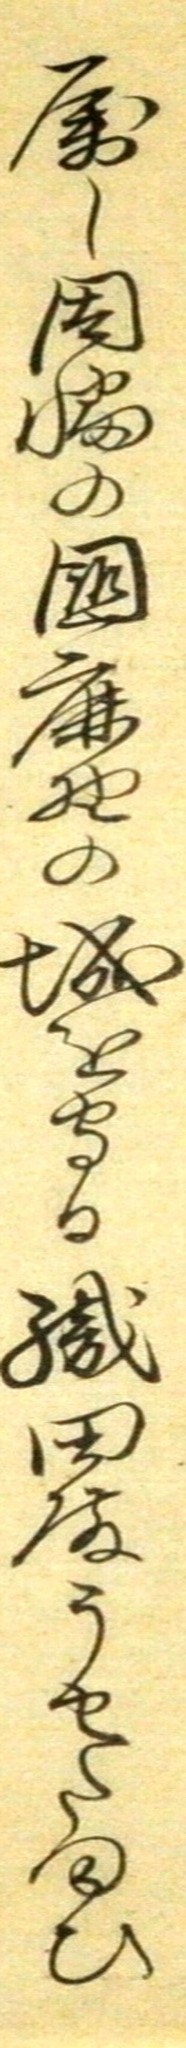属し因幡の国鹿野の城を守る織田殿うせたまひ
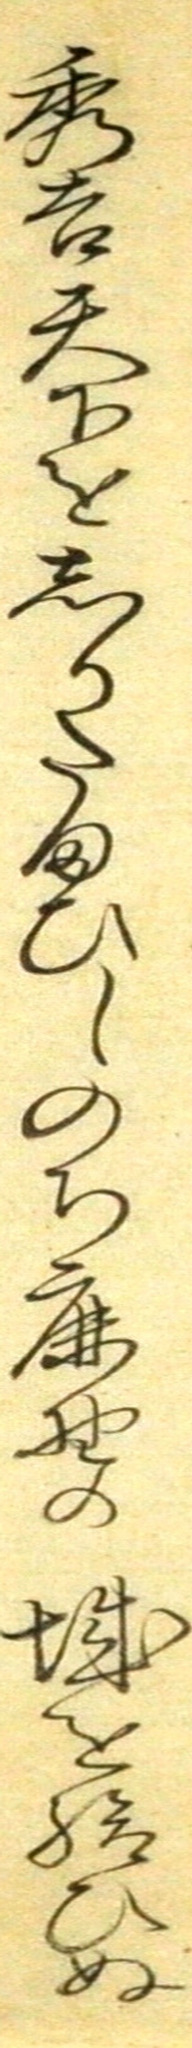秀吉天下をしりたまひしのち鹿野の城を給ひぬ
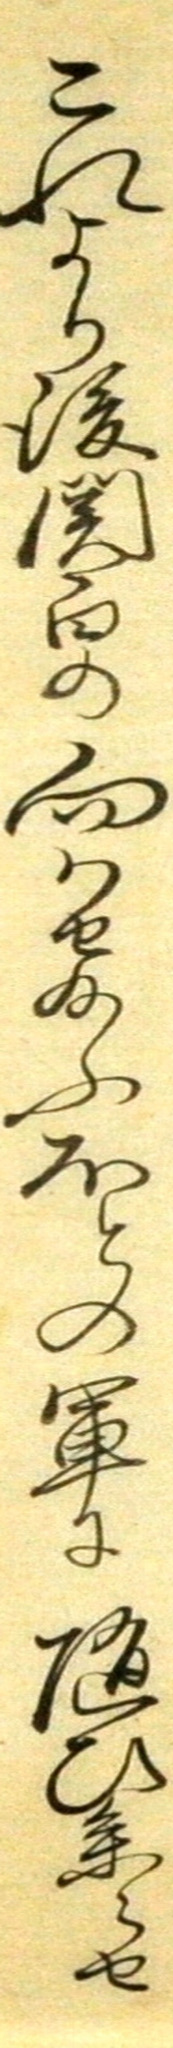これより後関白の向はせ給ふほとの軍に随ひ参らせ
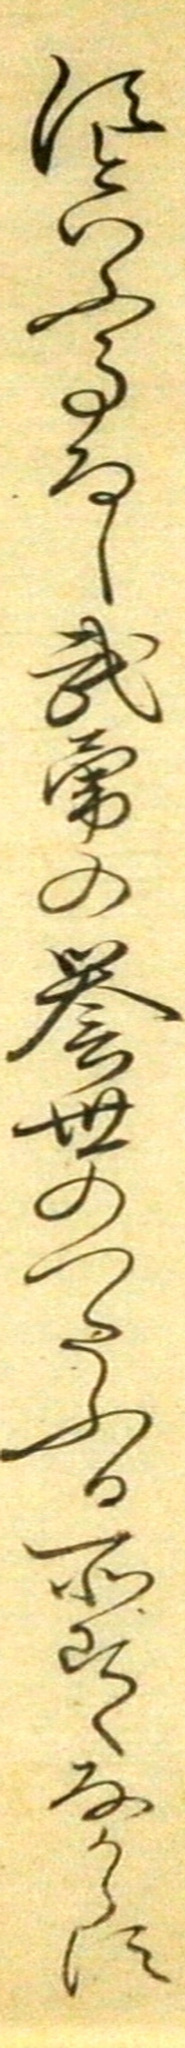すといふ事なし武勇の誉世のつたふる所すくなからす
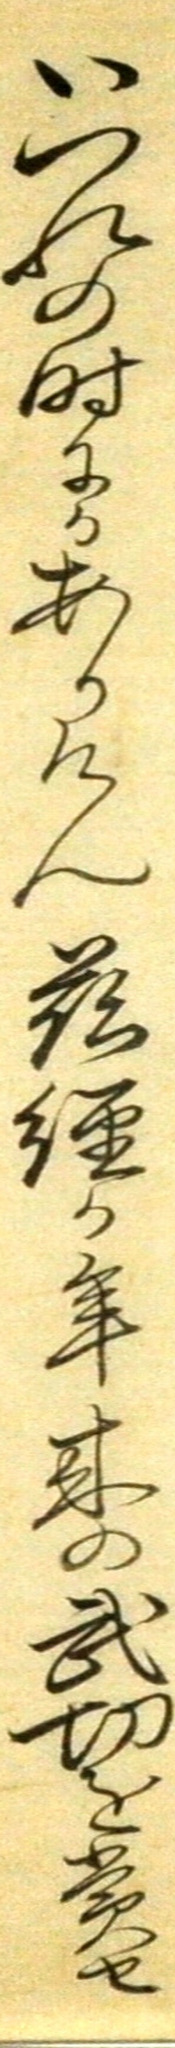いつれの時にかありけん茲経か年来の武功を賞せ
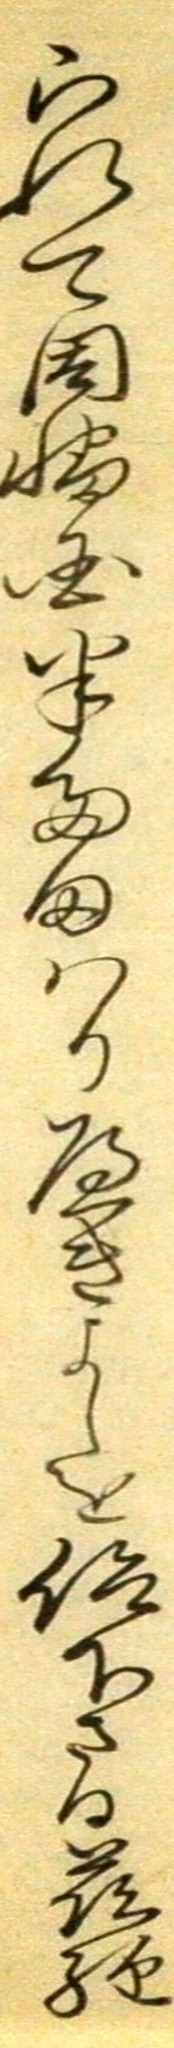られて因幡国半たまはりへきよしを仰下さる茲経
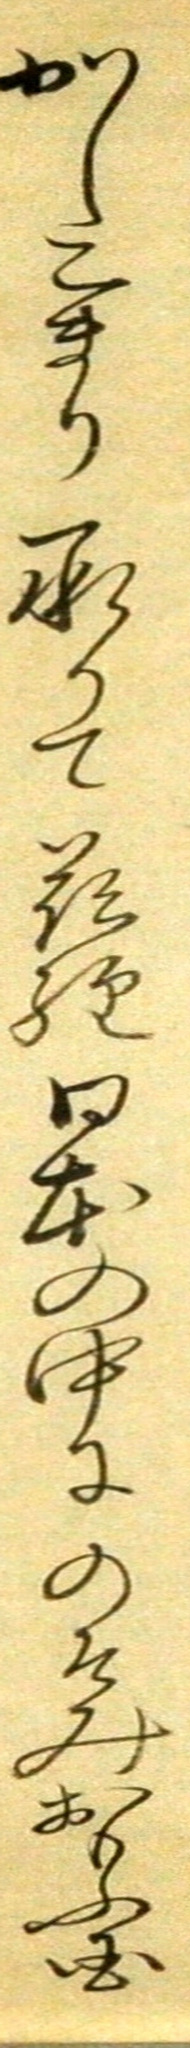かしこまり承りて茲経日本の中にのそみおもふ国
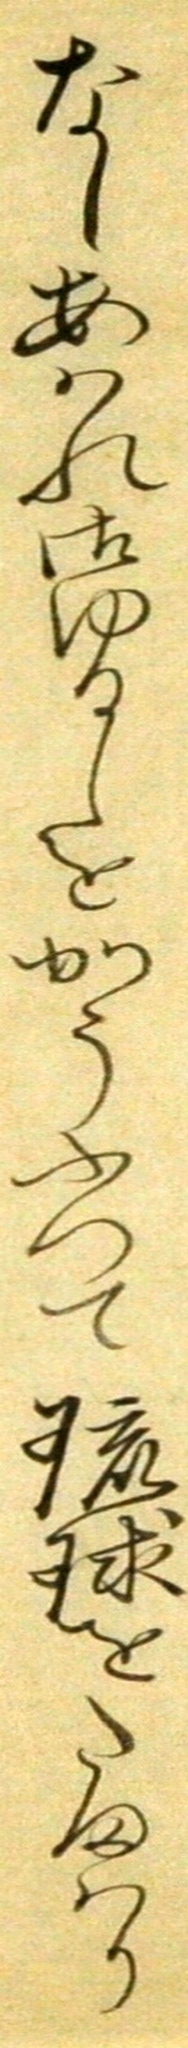なしあはれ御ゆるしをかうふつて琉球をたまはり
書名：藩翰譜（九・下）
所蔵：伊那市立高遠町図書館・合同会社AMANE
